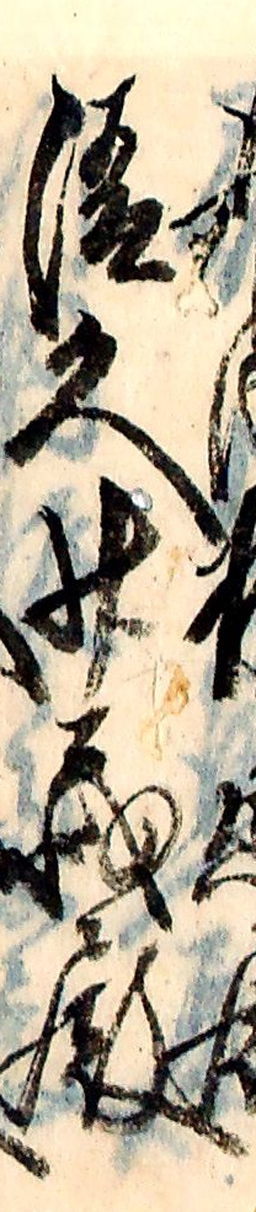清久竹蔵殿
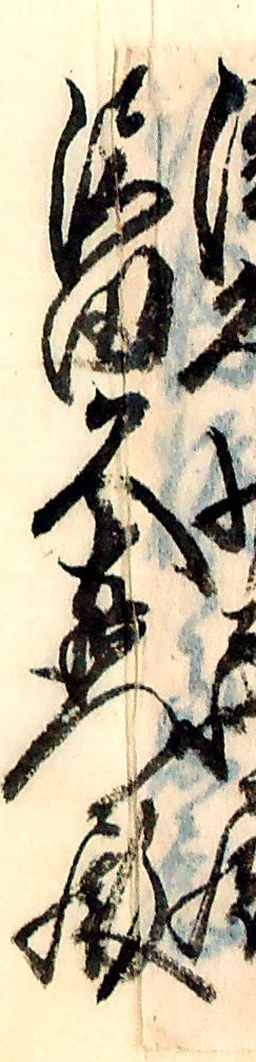沢田久左衛門殿
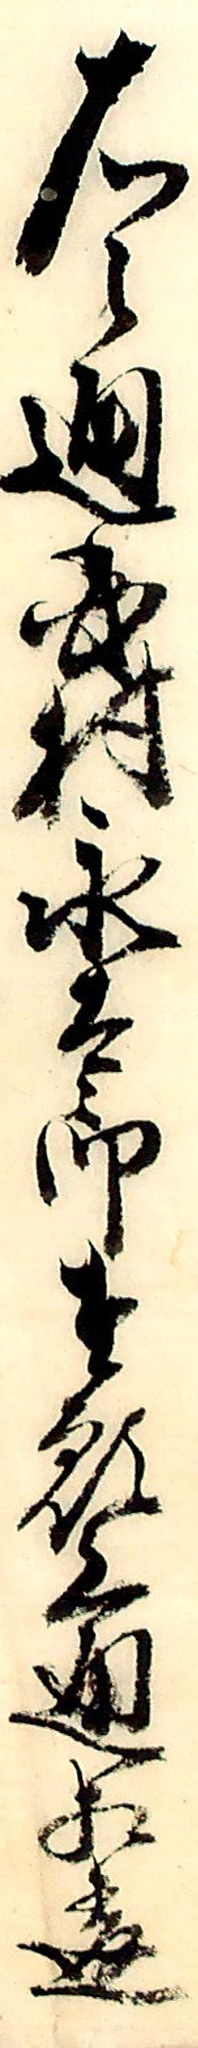右之通当村永太郎奉願上通相違
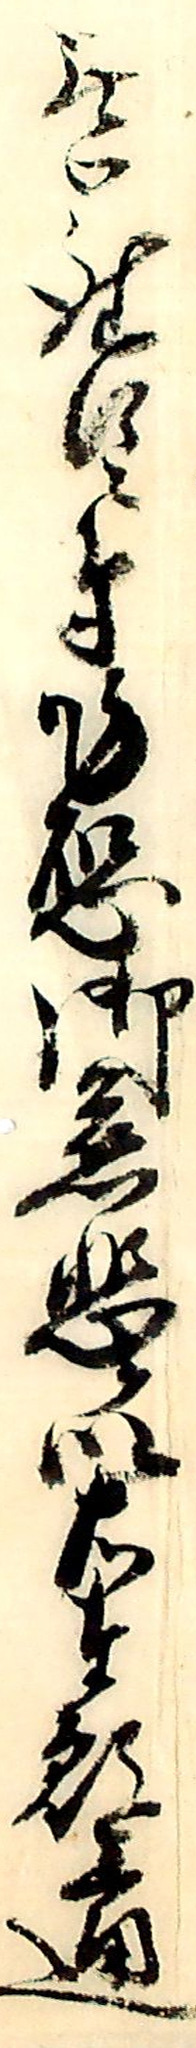無御座候に付乍恐御慈悲を以右奉願上通
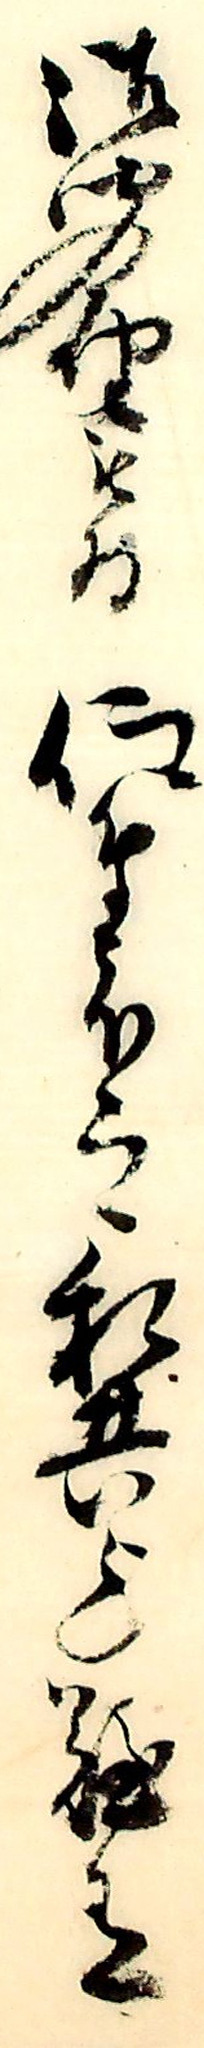御聞届被為仰付被下候はゝ私共迄難有
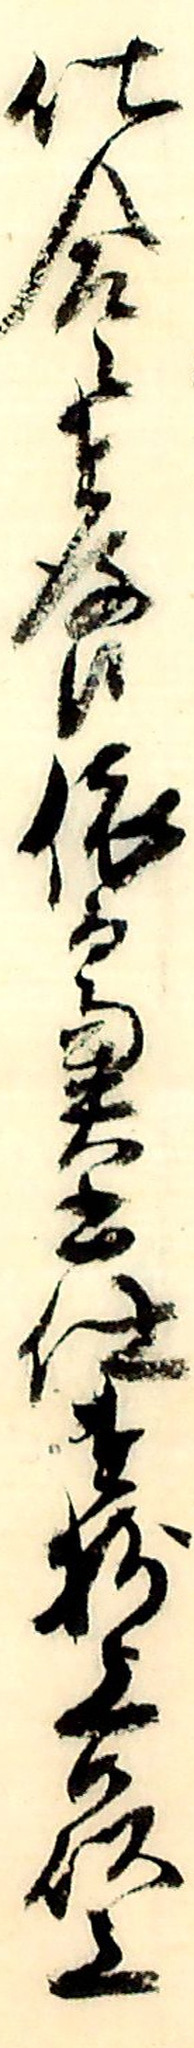仕合に奉存候依て奥書仕奉指上候以上
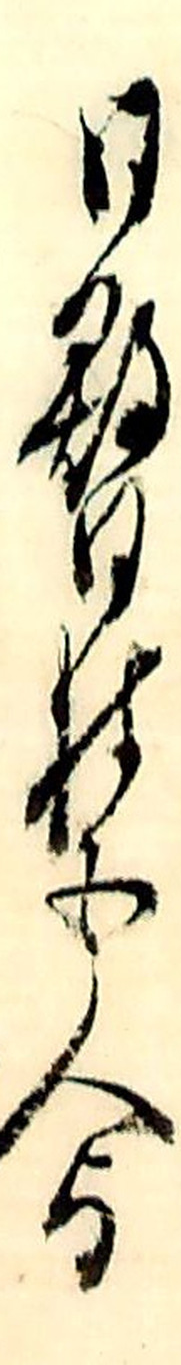同郡同村五人与
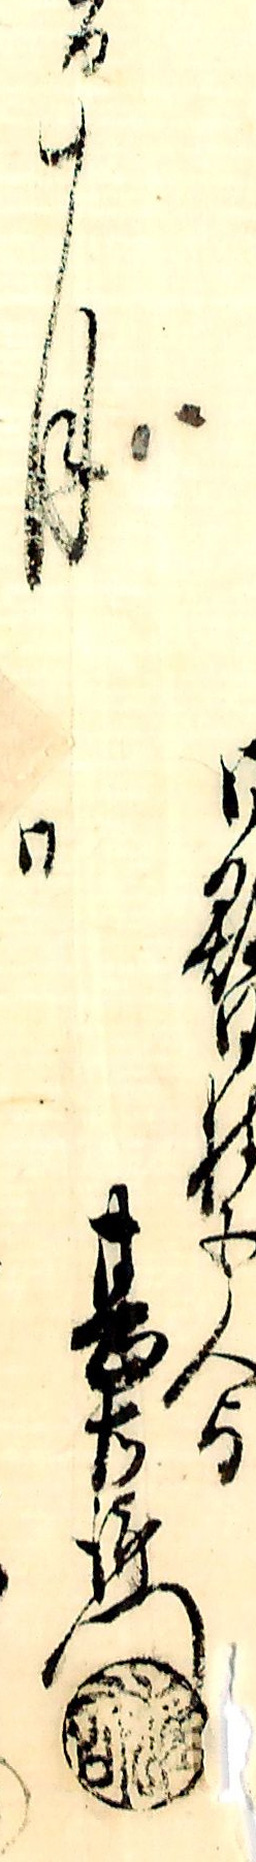酉十月甚右衛門
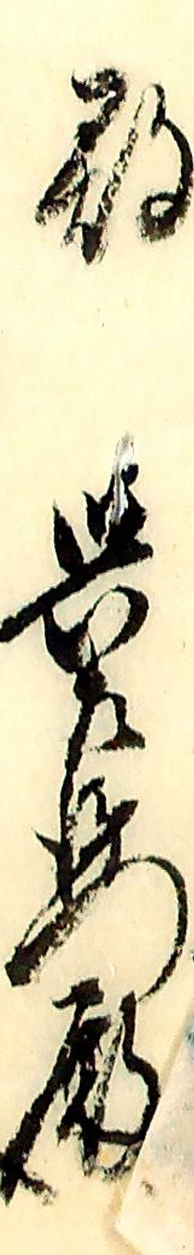郡与左衛門殿
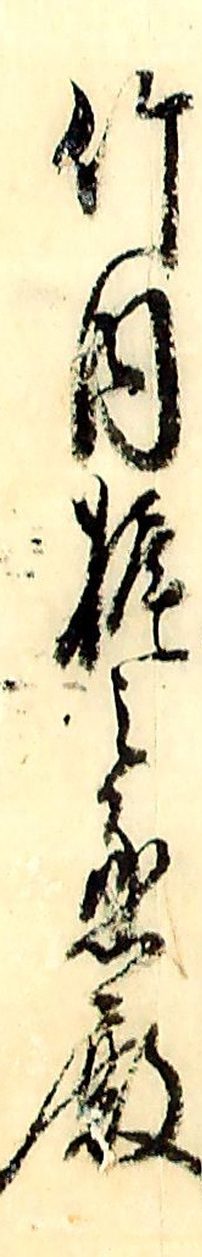竹内梶之丞殿

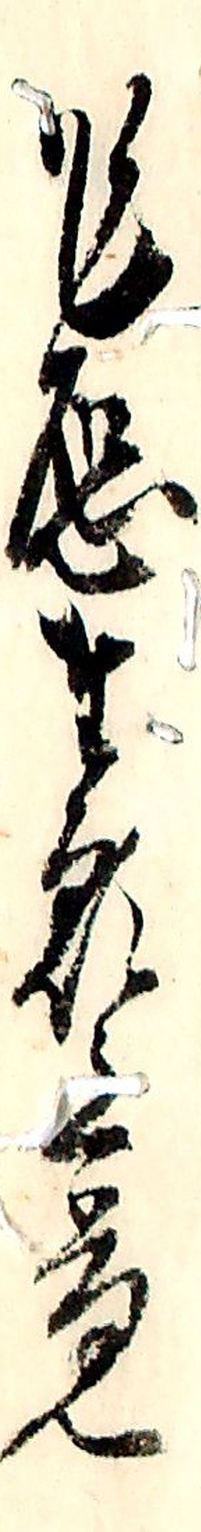乍恐奉願上覚
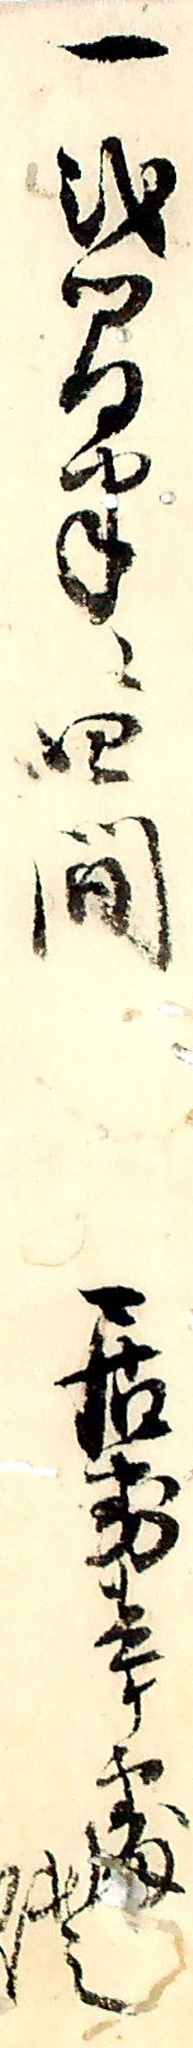一弍間半に四間居宅壱ケ所
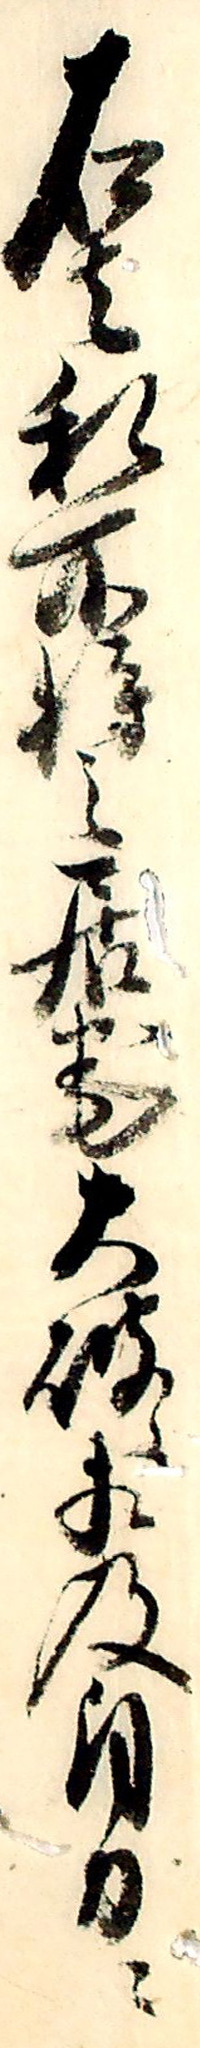右は私所持之居宅大破に相及自力に
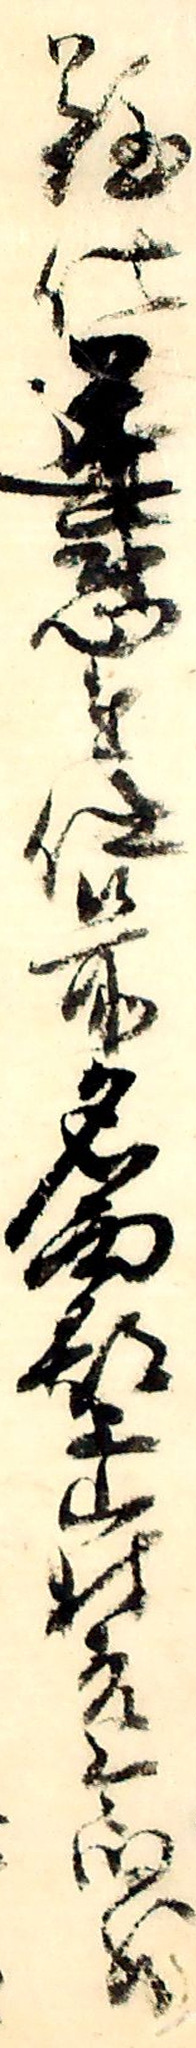難仕迷惑奉仕候所名西郡上山村吉三郎義
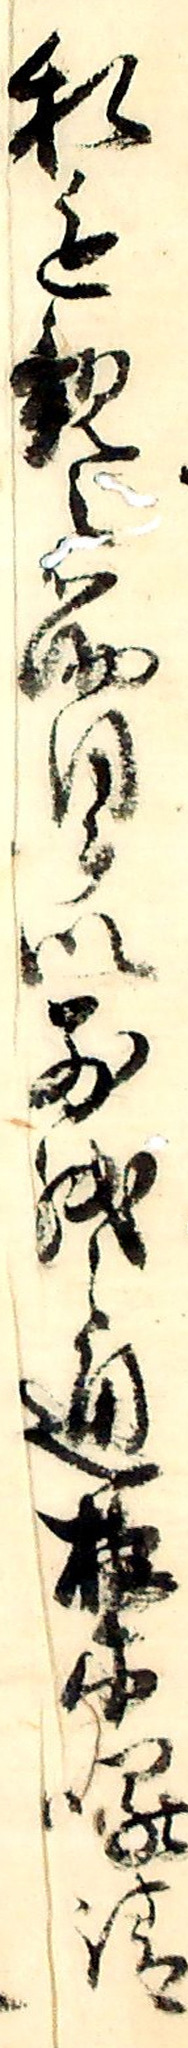私近親之筋目を以別紙之通松木唯請
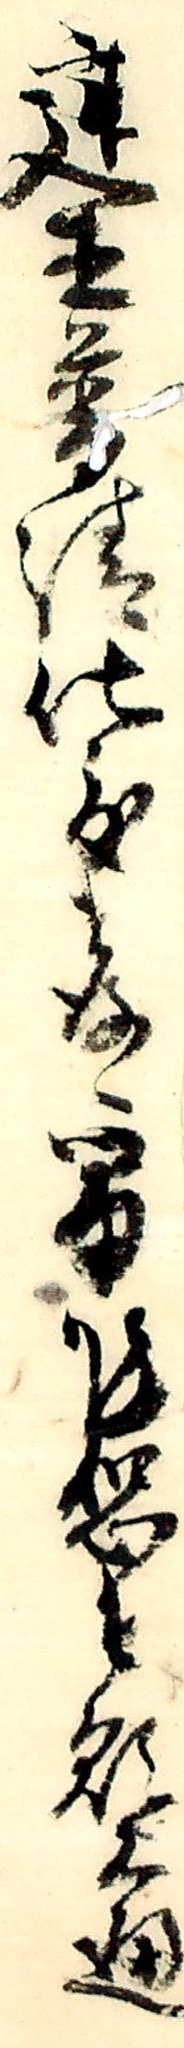建直普請仕度奉存候間乍恐奉願上通
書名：諸御願書控(後藤氏壱番）
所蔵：鳴門教育大学 Naruto University of Education
